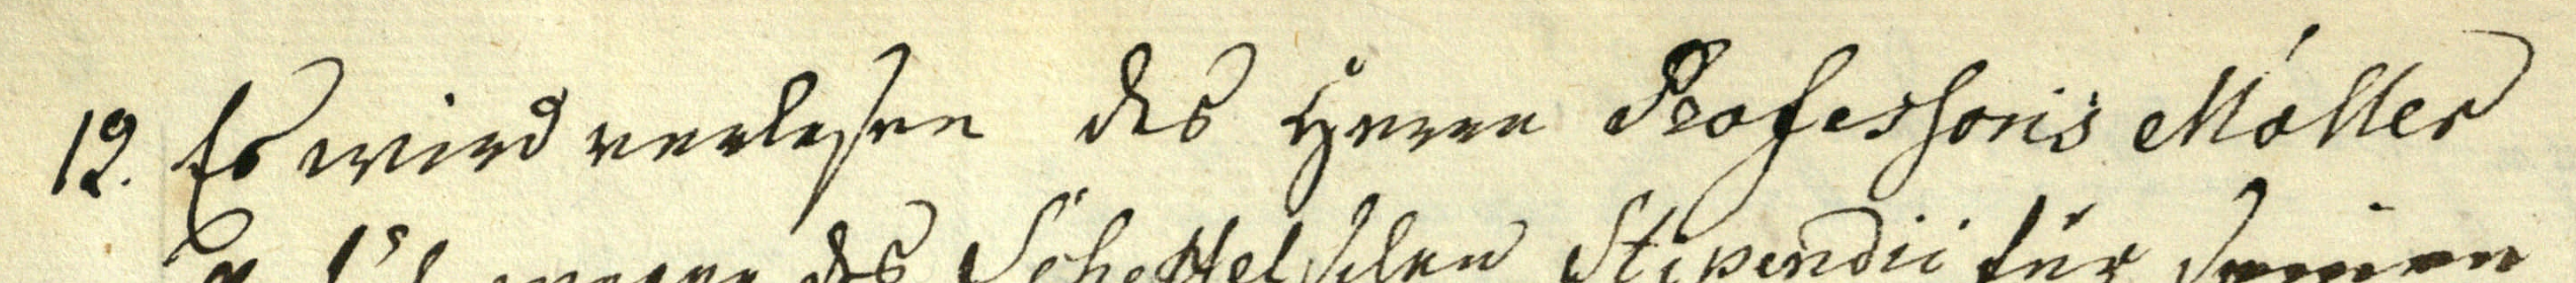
12. Es wird verlesen des Herrn Professoris Möller
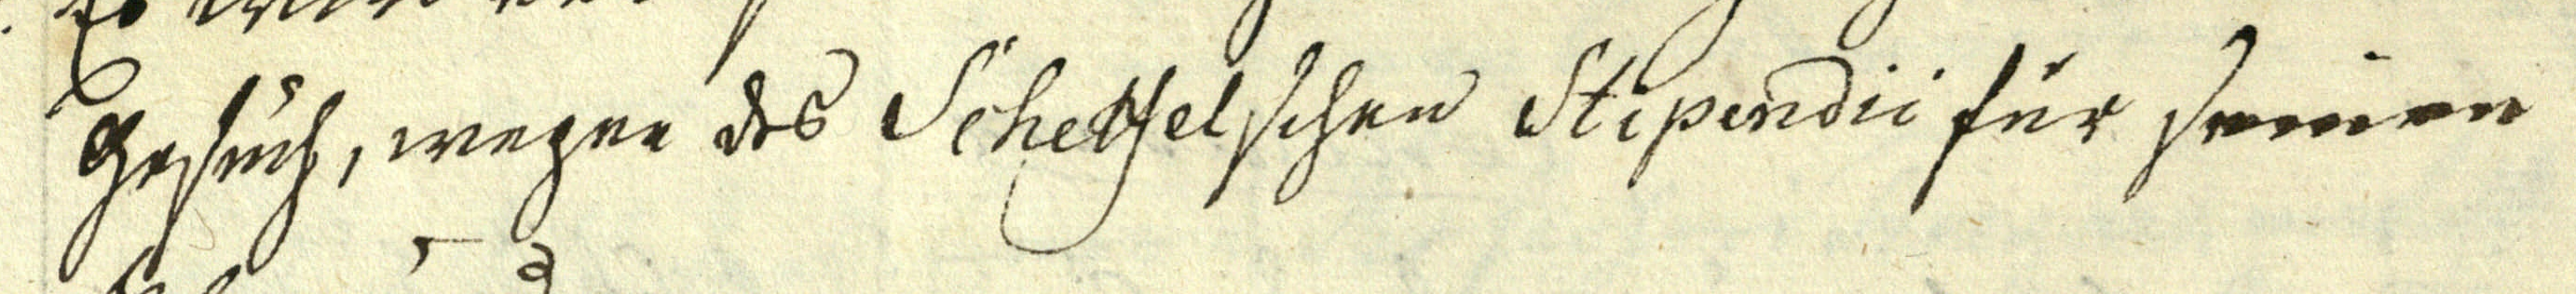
Gesuch, wegen des Scheffelschen Stipendii für seinen
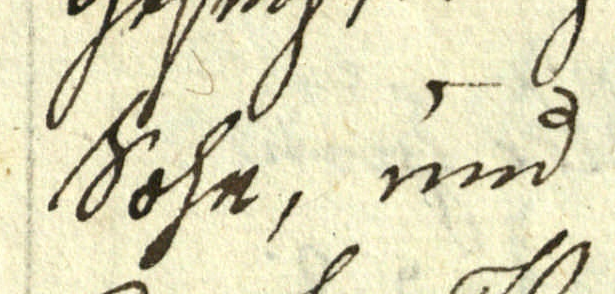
Sohn, und
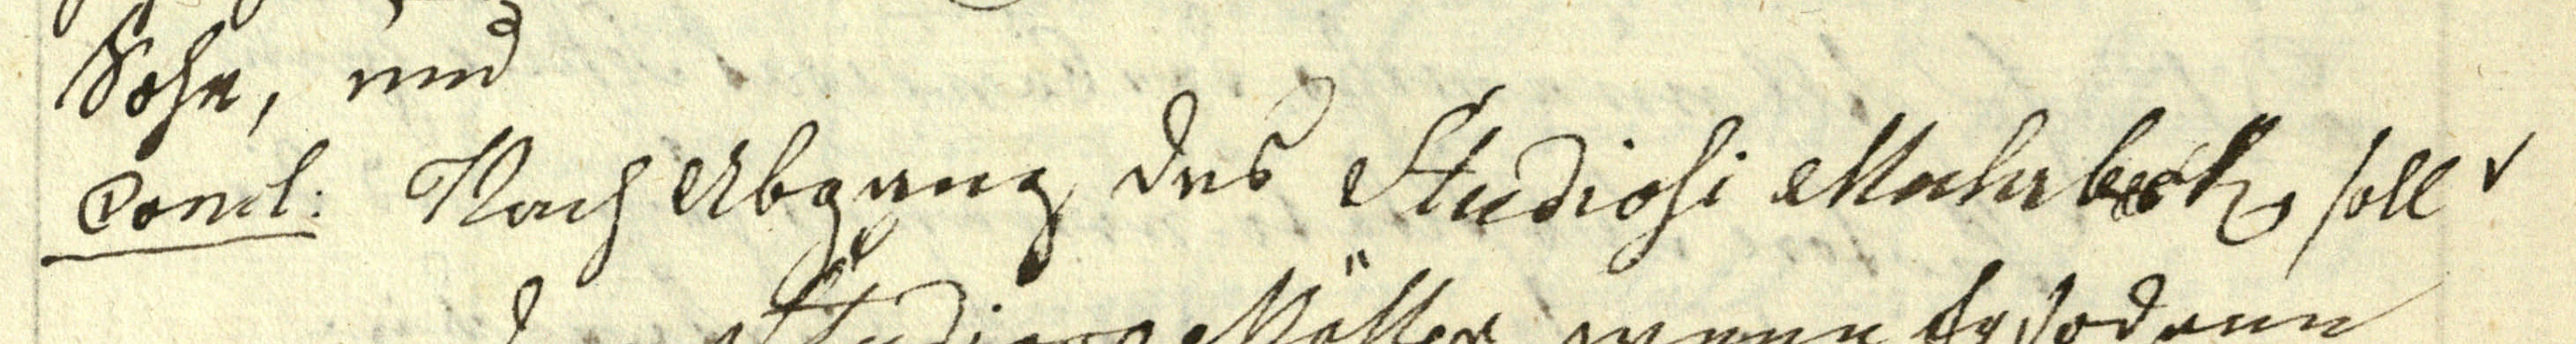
Concl. Nach Abgang des Studiosi Muhrbeck soll¬
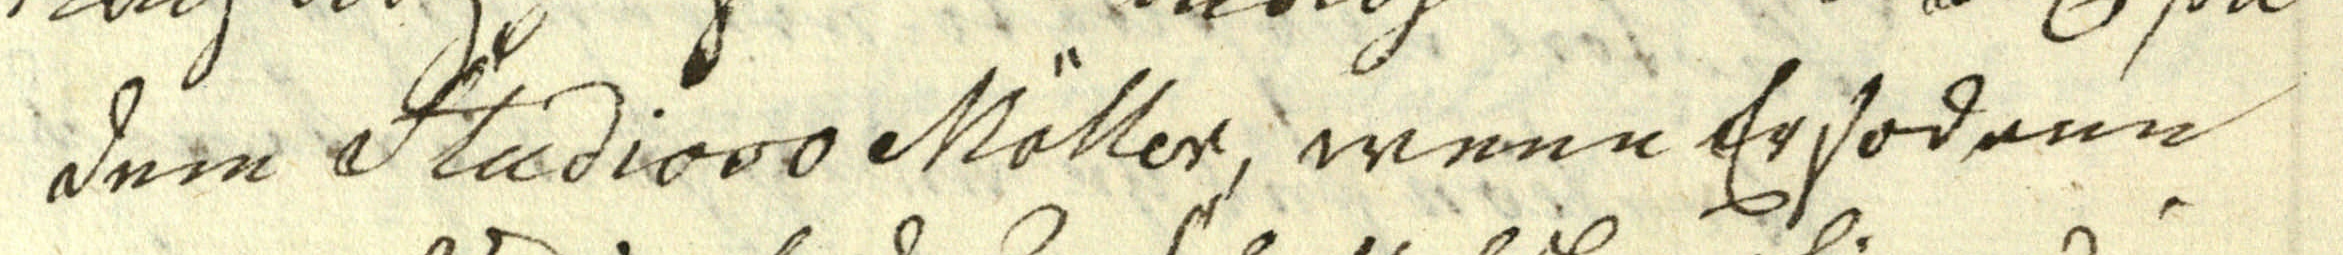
dem Studioso Möller, wenn Er sodann
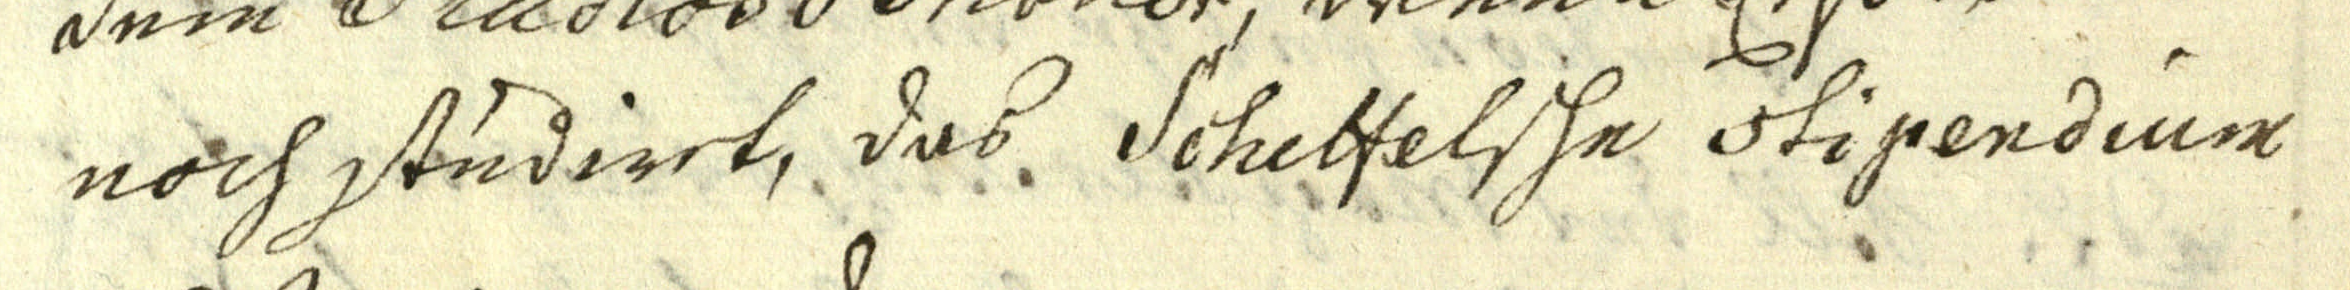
noch studiret, das Scheffelsche Stipendium
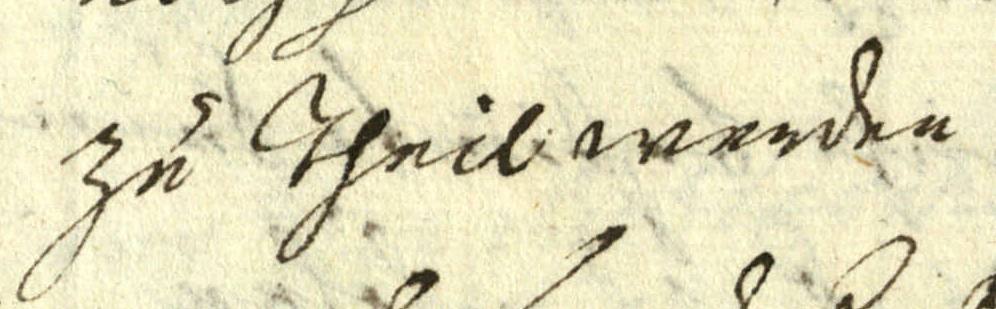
zu Theil werden.
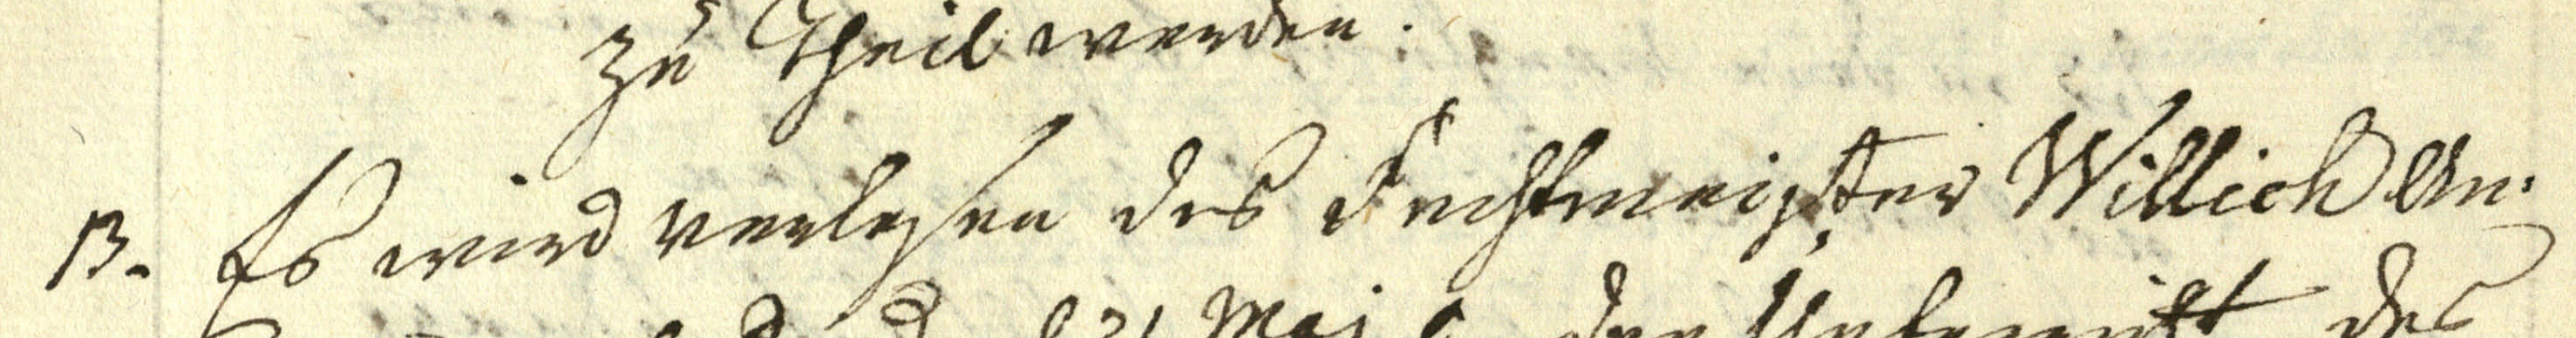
13. Es wird verlesen des Fechtmeister Willich An¬
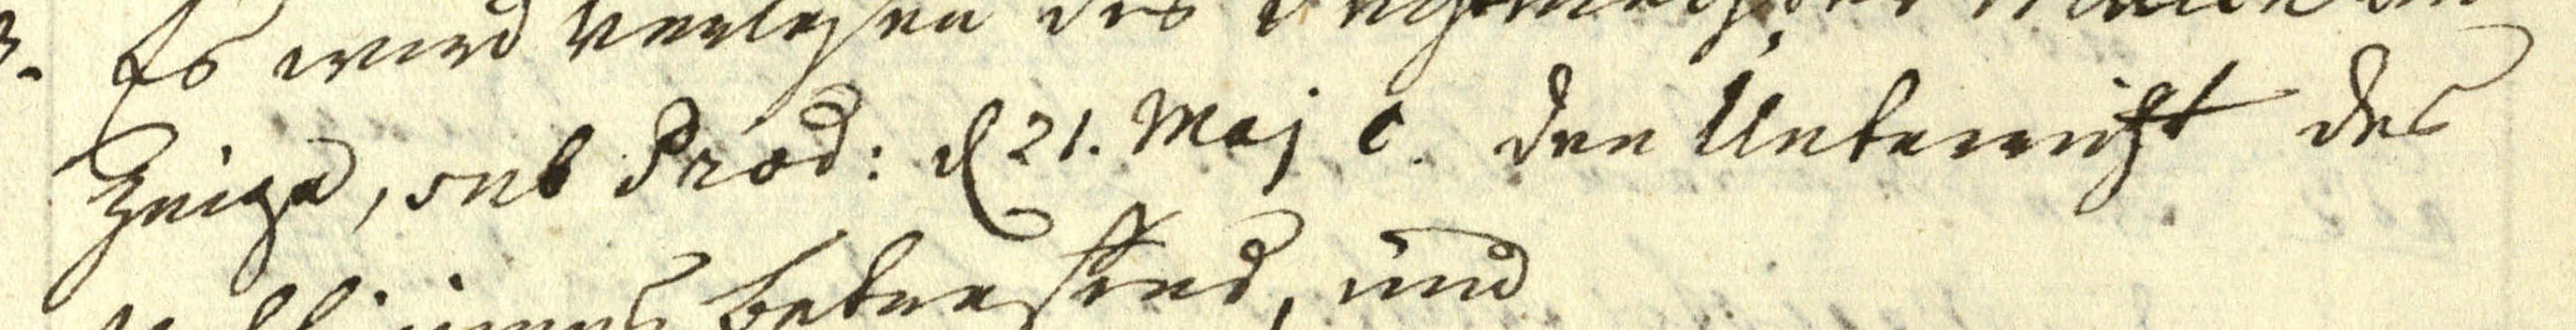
zeige sub Prod. d 21. Maj c. den Unterricht des
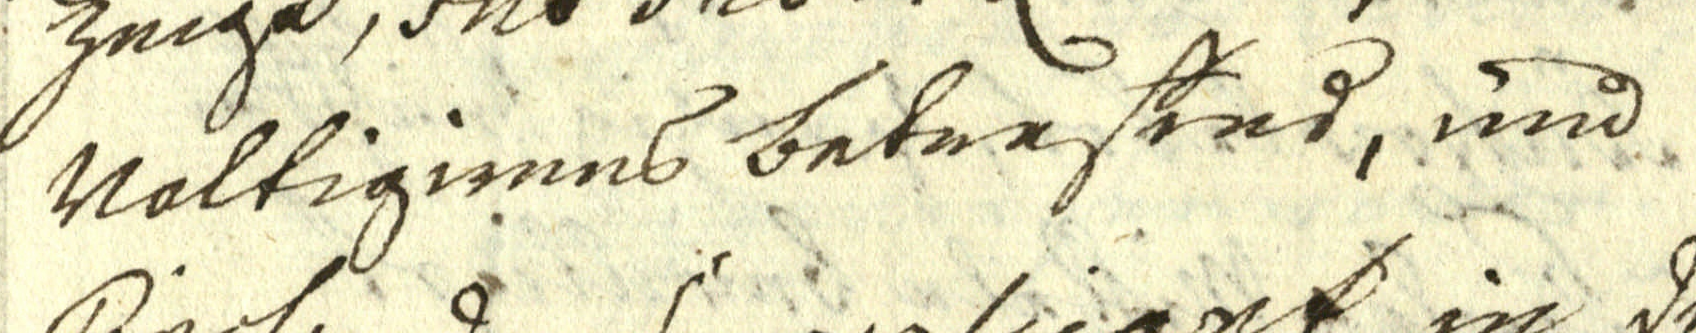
Voltigirens betreffend, und
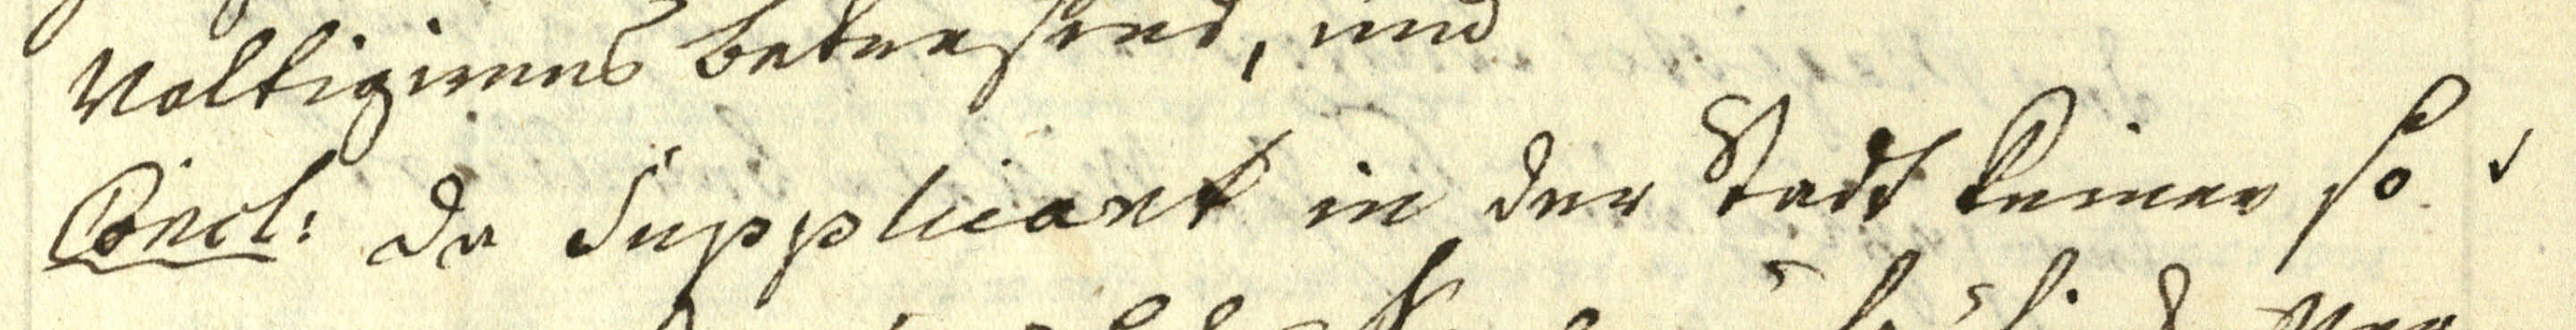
Concl. da Supplicant in der Stadt keinen so
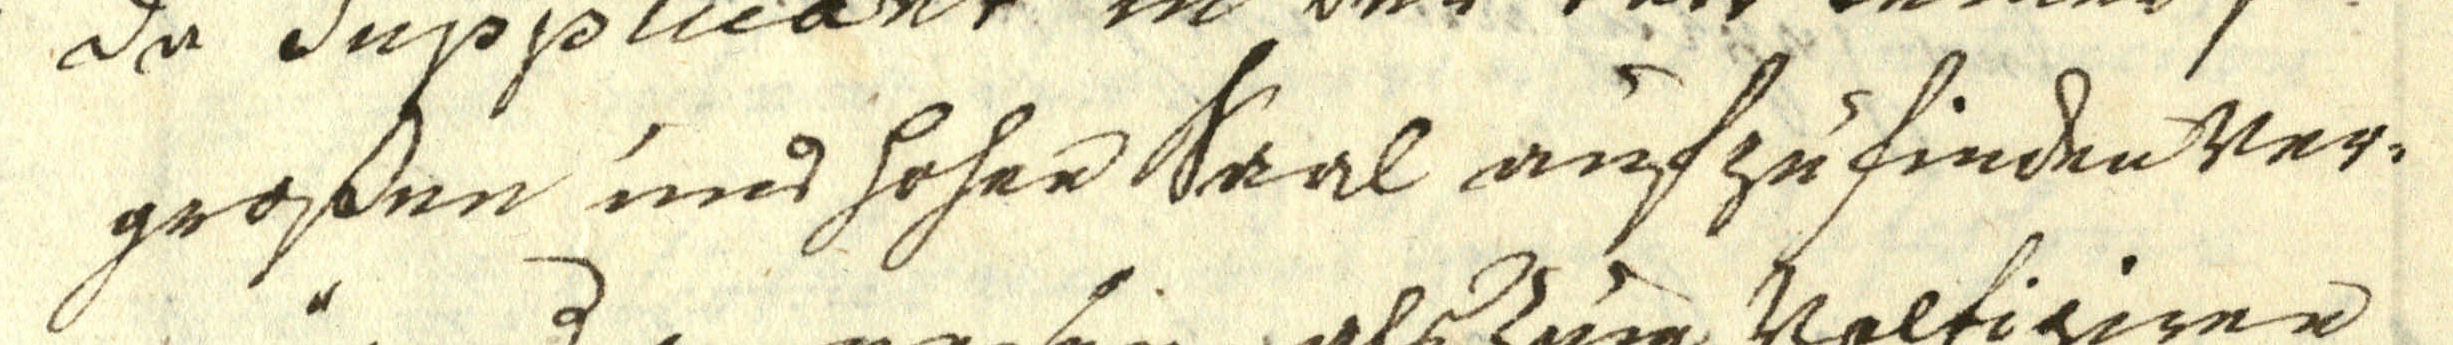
großen und hohen Saal aufzufinden ver¬
